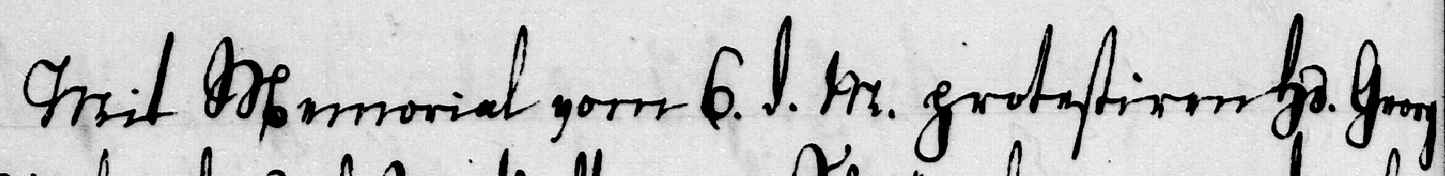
Mit Memorial vom 6. d. M. protestiren Hs. Geo¬
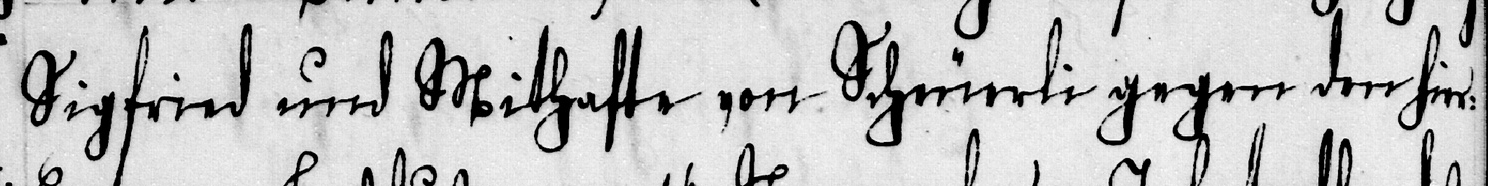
Sigfried und Mithafte von Scheuerli gegen den hie¬
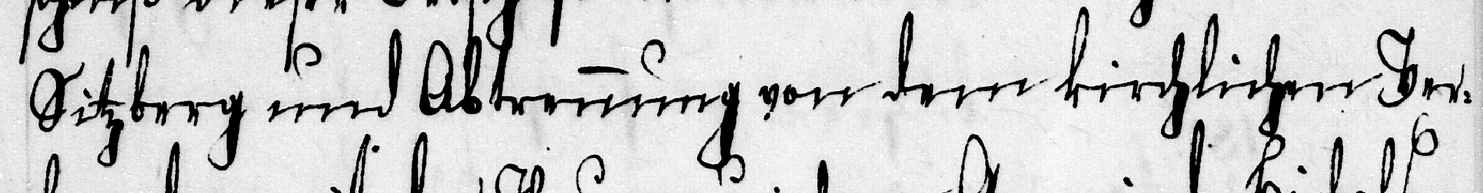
Sitzberg und Abtrennung von dem kirchlichen Ver¬
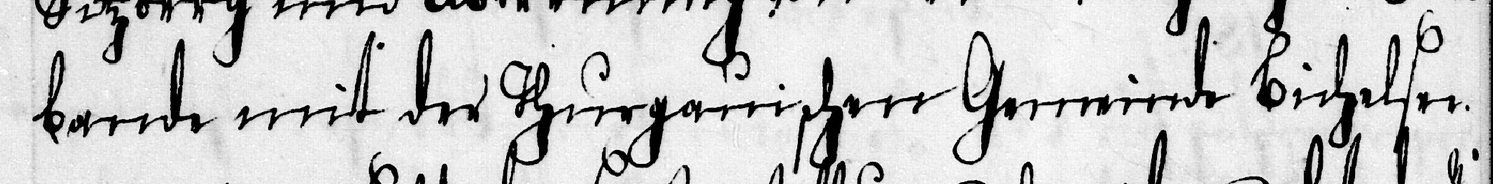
bande mit der Thurgauischen Gemeinde Bichelse¬
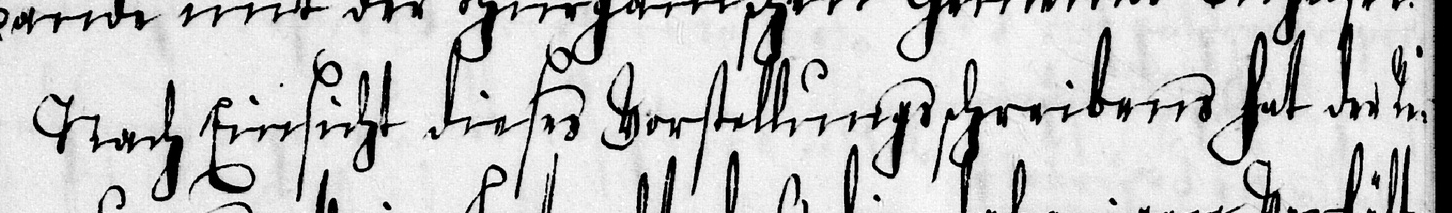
Nach Einsicht dieses Vorstellungsschreibens hat der R¬
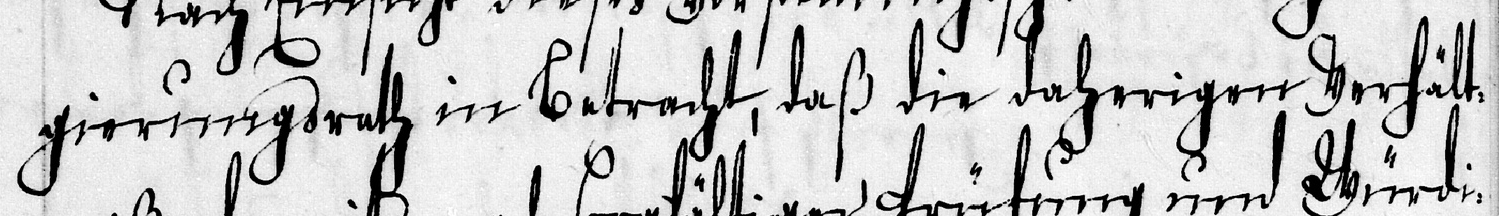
egierungsrath in Betracht, daß die daherigen Verhäl¬
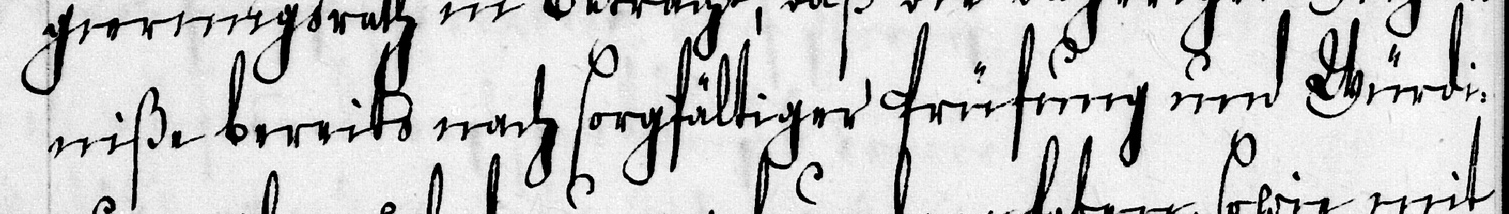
tniße bereits nach sorgfältiger Prüfung und Würdi¬
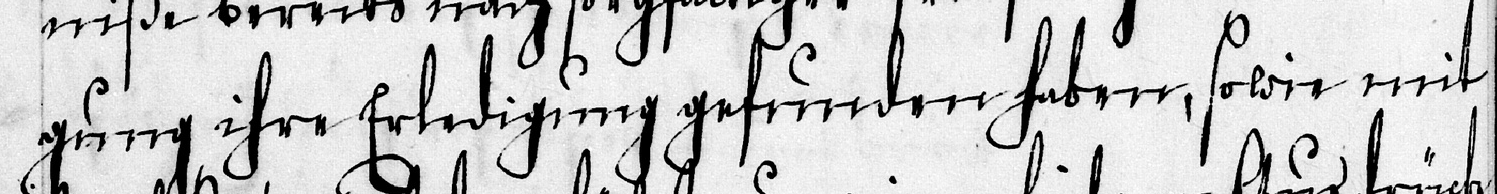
gung ihre Erledigung gefunden haben, sowie mit
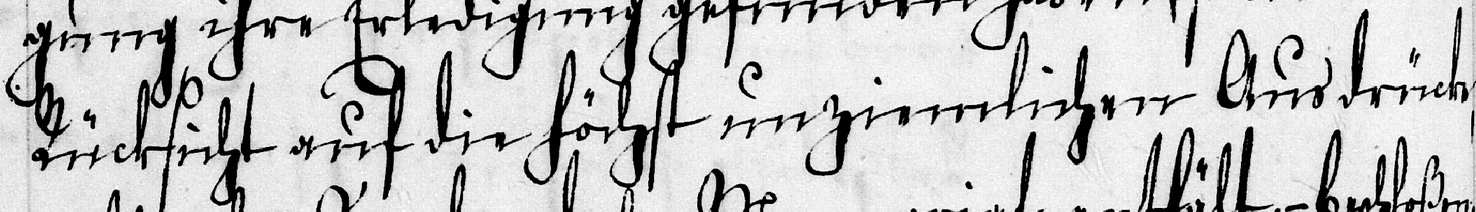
Rücksicht auf die höchst unziemlichen Ausdrüc¬
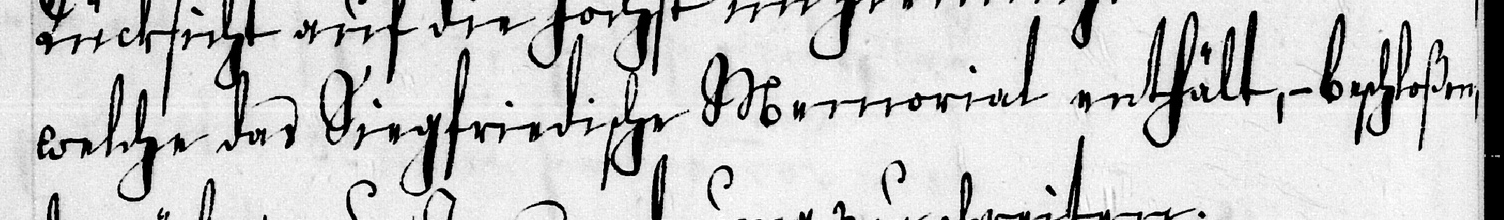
welche das Siegfriedische Memorial enthält, – beschloß¬
